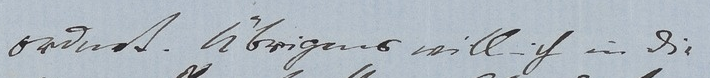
ordnet. Übrigens will ich in die
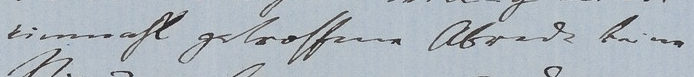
einmahl getroffene Abrede keine
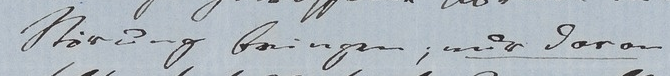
Störung bringen; nur daran
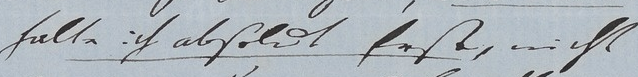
halte ich absolut fest, nicht
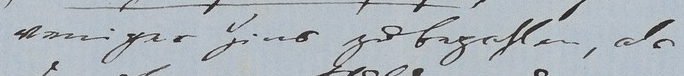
weniger Zins zu bezahlen, als
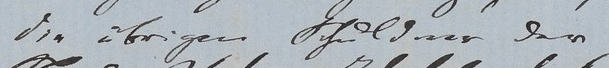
die übrigen Schuldner der
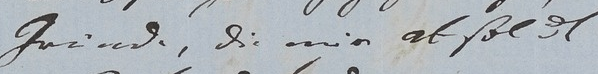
Gründe, die mir absolut
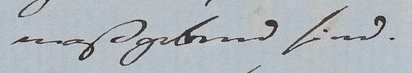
maßgebend sind.
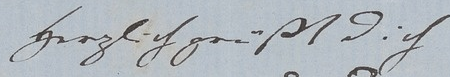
Herzlich grüßt Dich
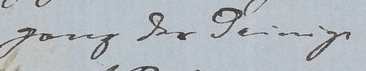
ganz der Deinige
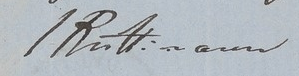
J Rüttimann
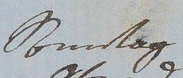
Sonntag
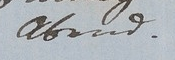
Abend.
